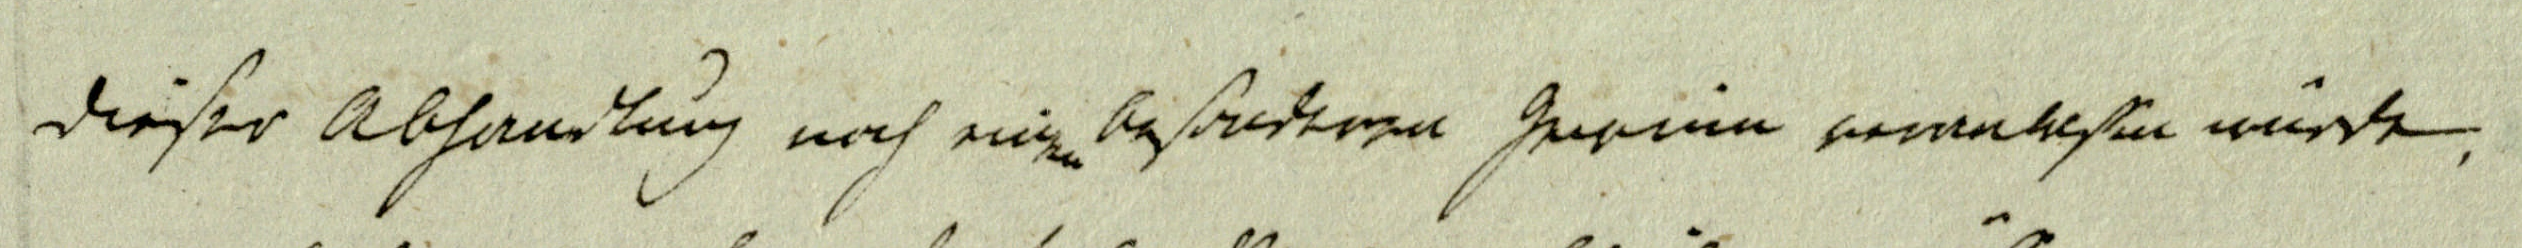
dieser Abhandlung noch einen besonderen Gewinn veranlassen würde,
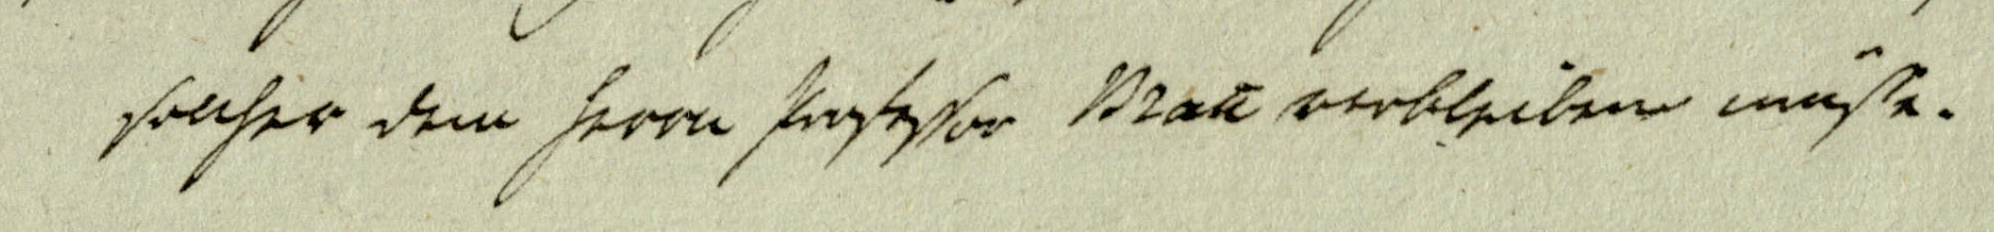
solcher dem Herrn Professor Bratt verbleiben müsse.
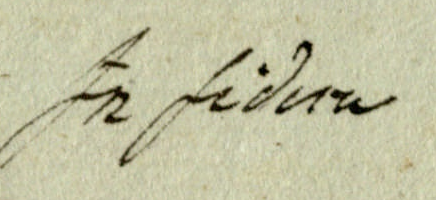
In fidem
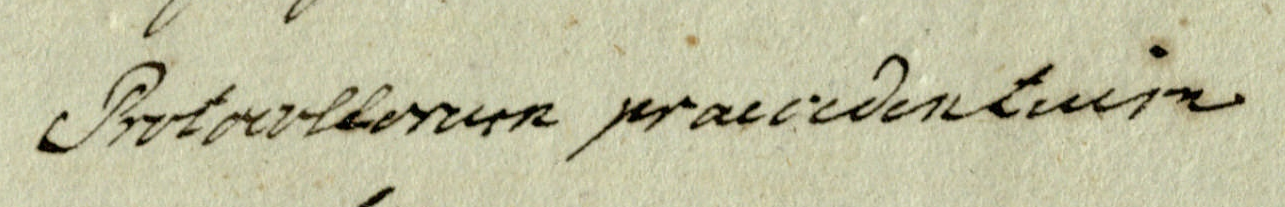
Protocollorum praecedentium
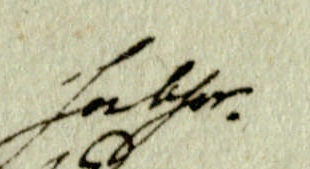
subscr.
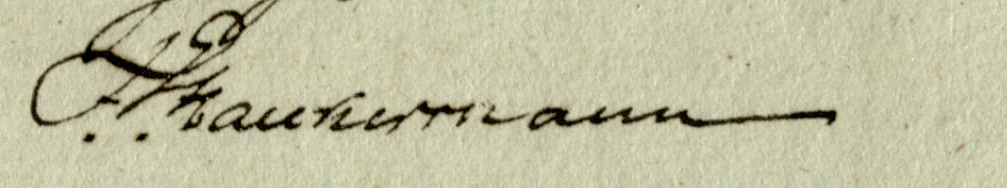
J.G. Haeckermann
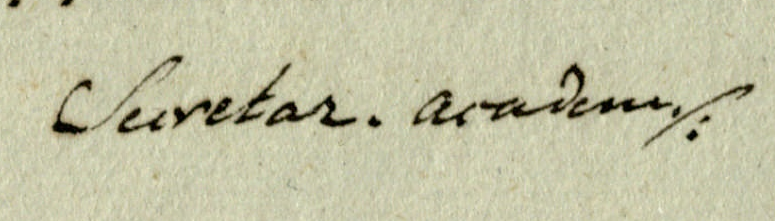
Secretar. Academ./:
